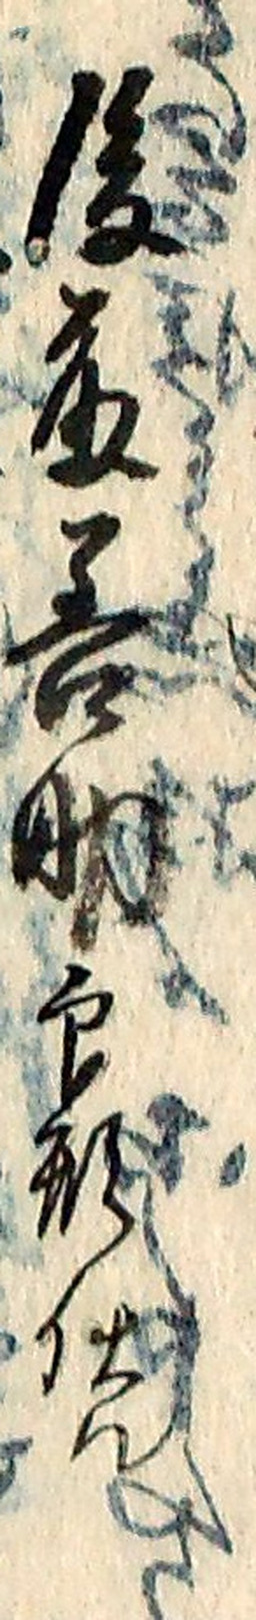後藤善助印形仕る
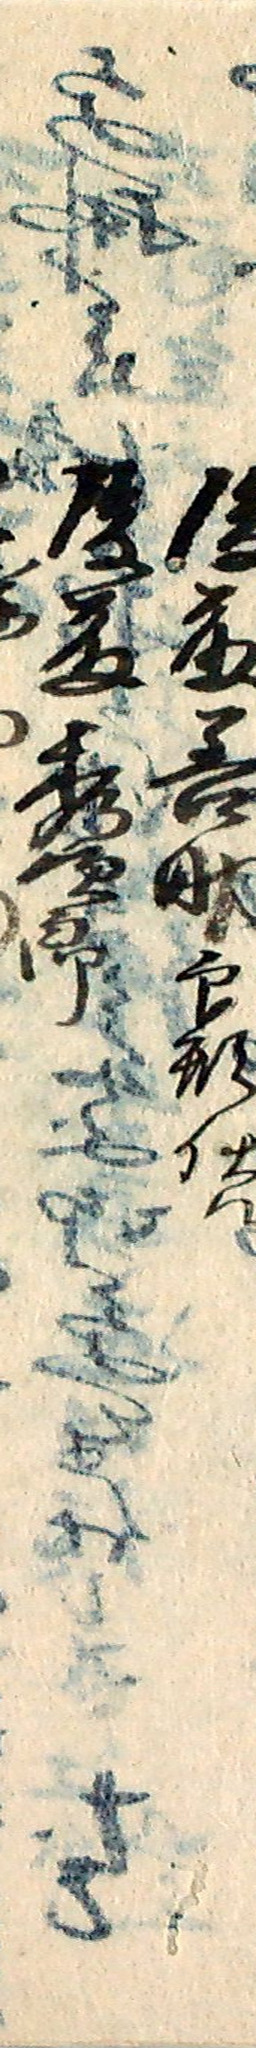後藤秀次郎
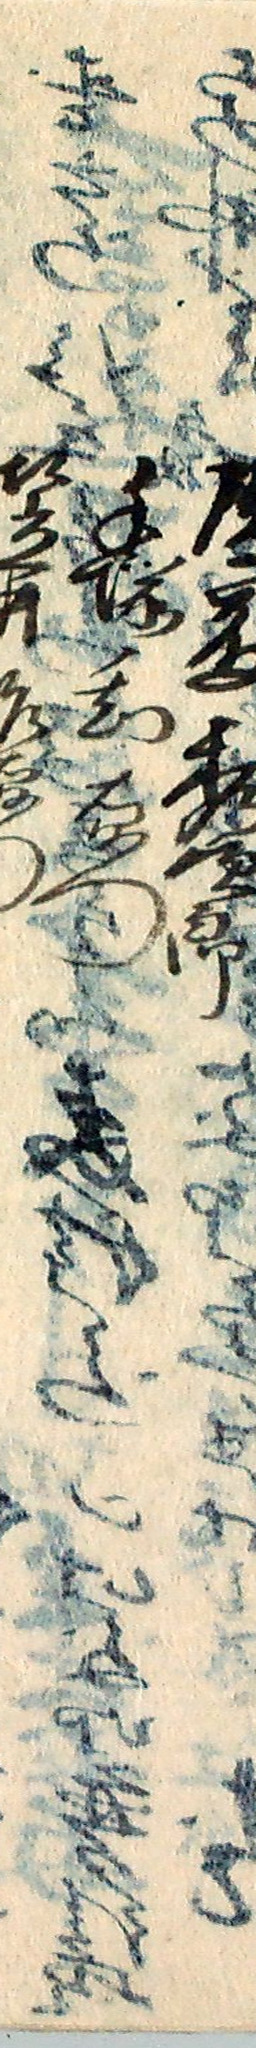盛六右衛門
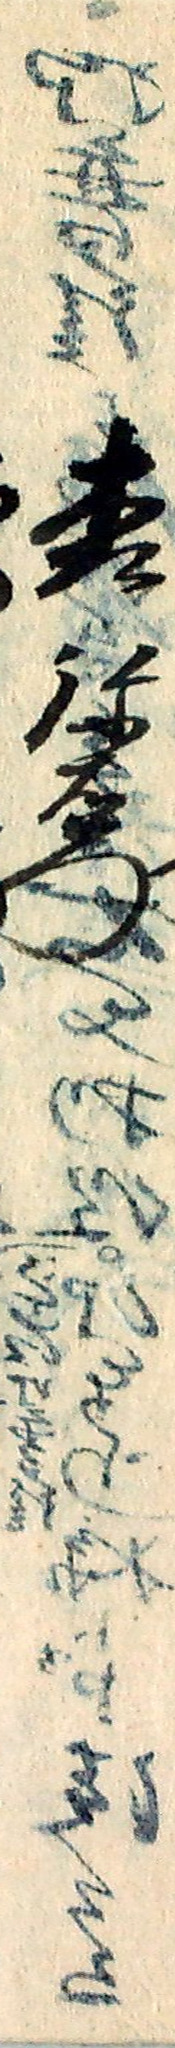森弥右衛門
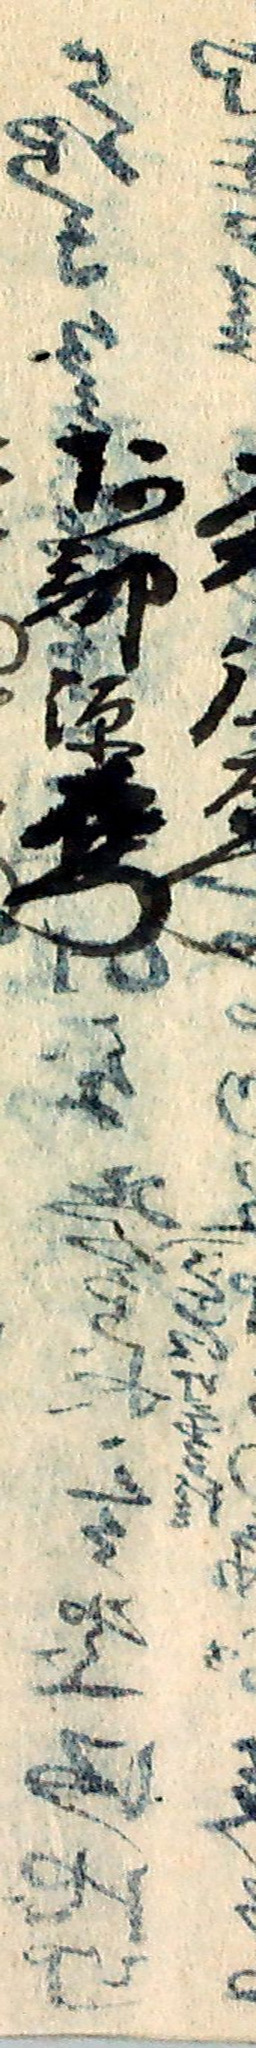阿部源右衛門

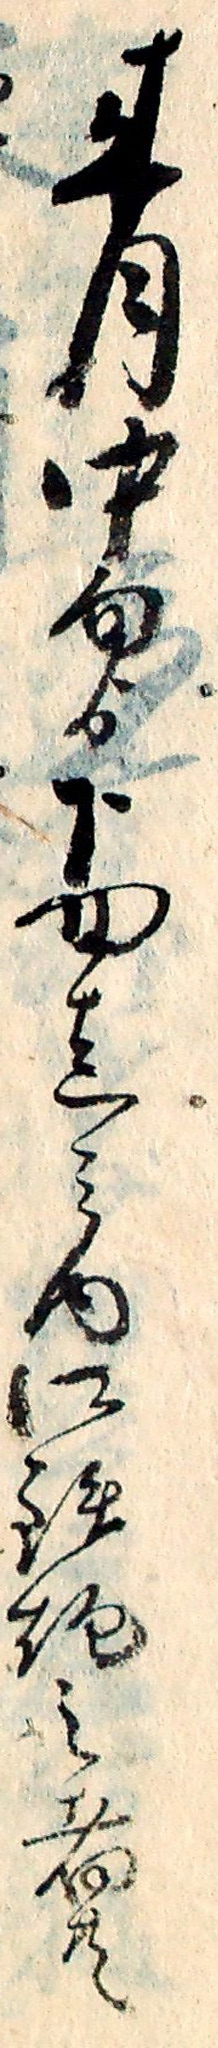来月中旬ゟ下旬迄之内郷鉄炮之者共
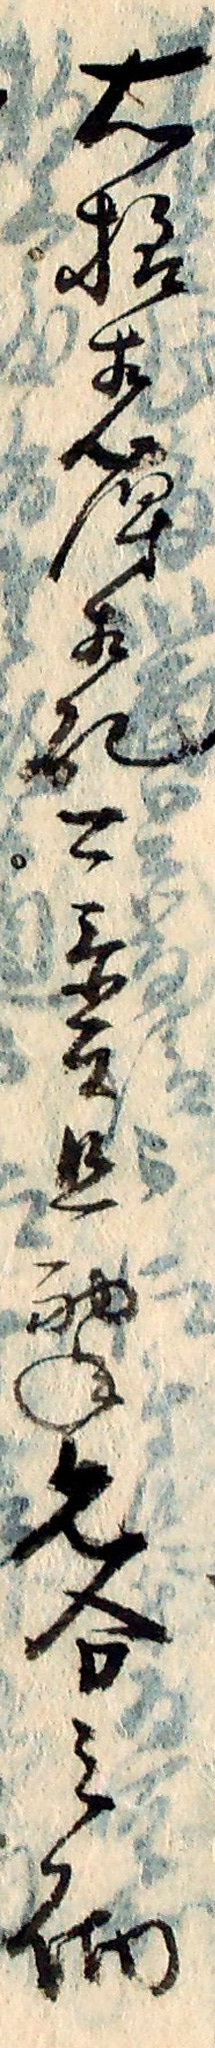右様相心得相配可置候且初年見分之砌
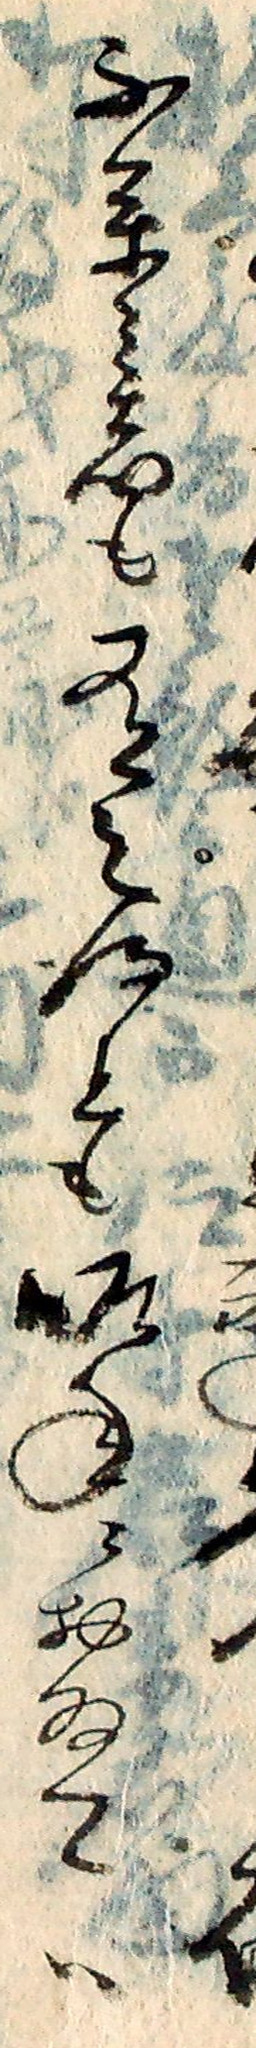不参之者も有之候得とも昨年におゐては
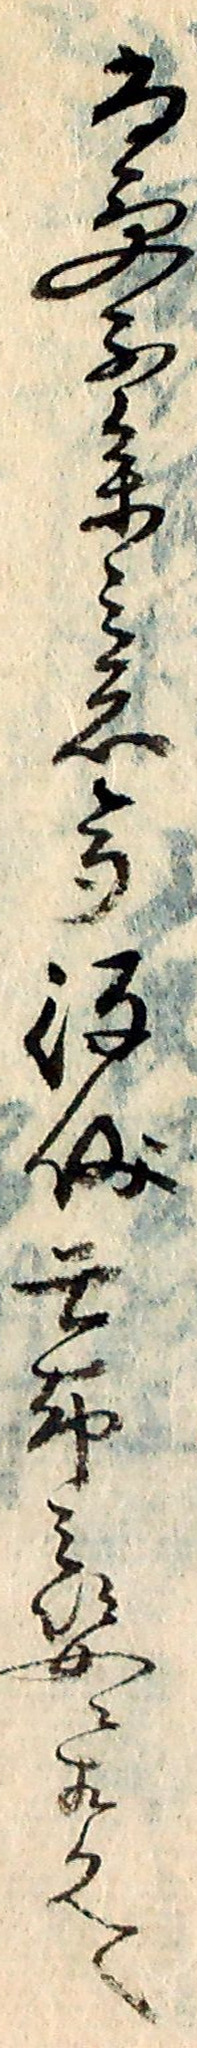尚更不参之者多役儀忘却之姿に相見へ
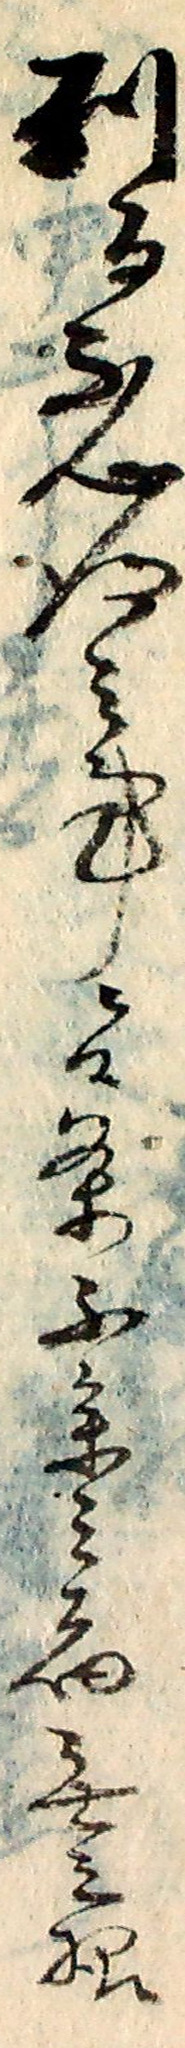到て不心得之事に候条不参之者無之様
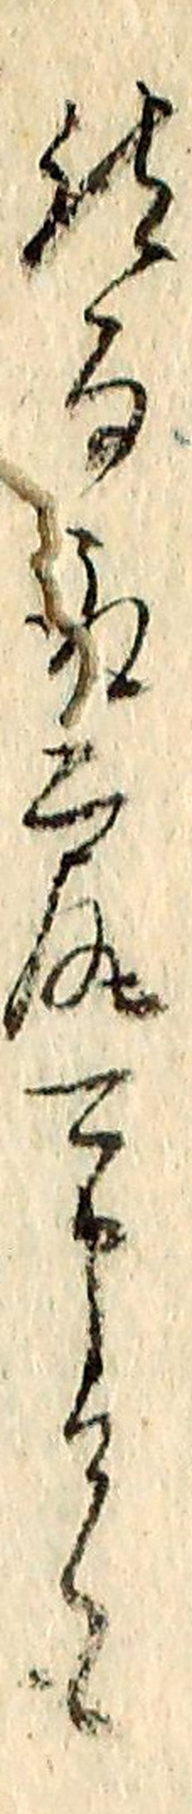然と取究可申候以上
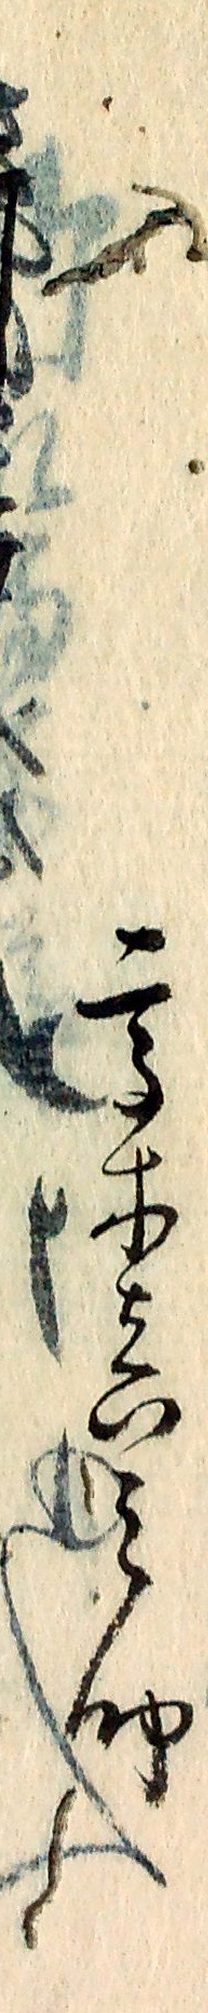高木真之助
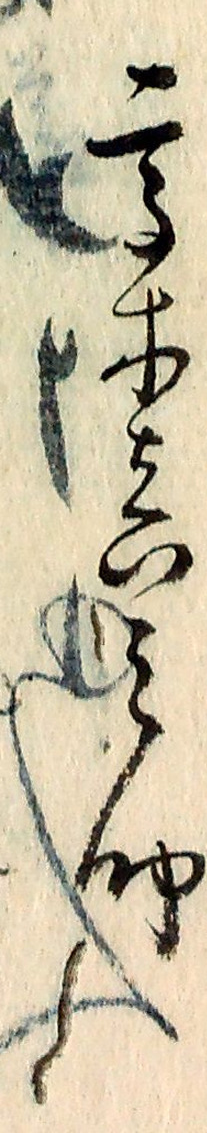高木真之助
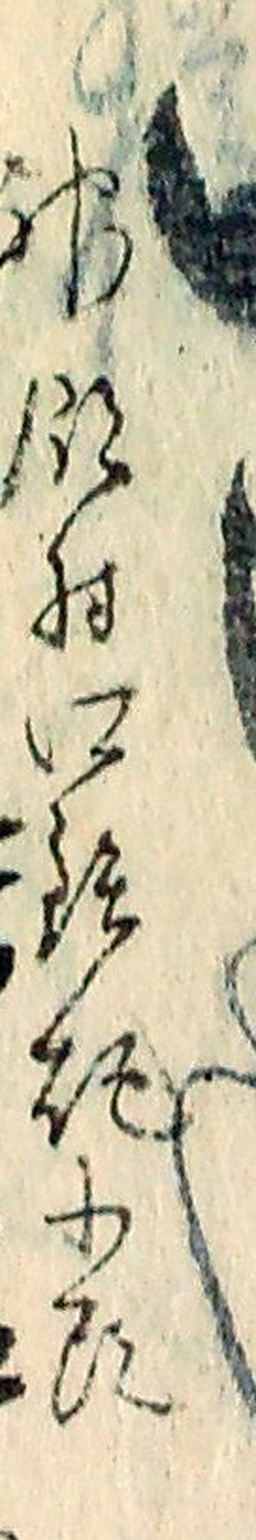神領村郷鉄炮小頭
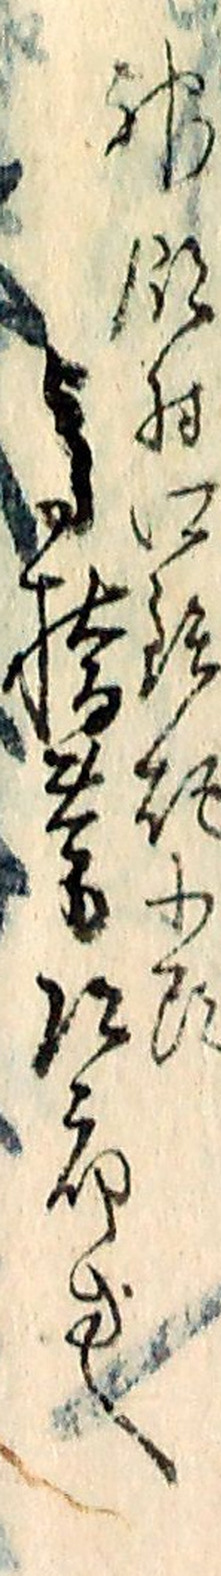高橋芳次郎方へ
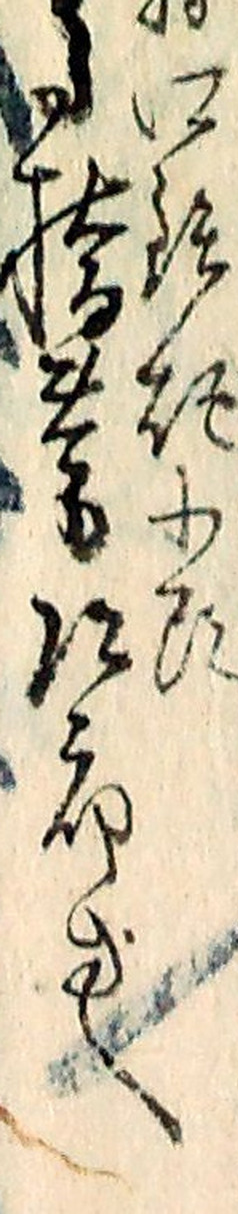高橋芳次郎方へ
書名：諸御願書控(後藤氏壱番）
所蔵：鳴門教育大学 Naruto University of Education
